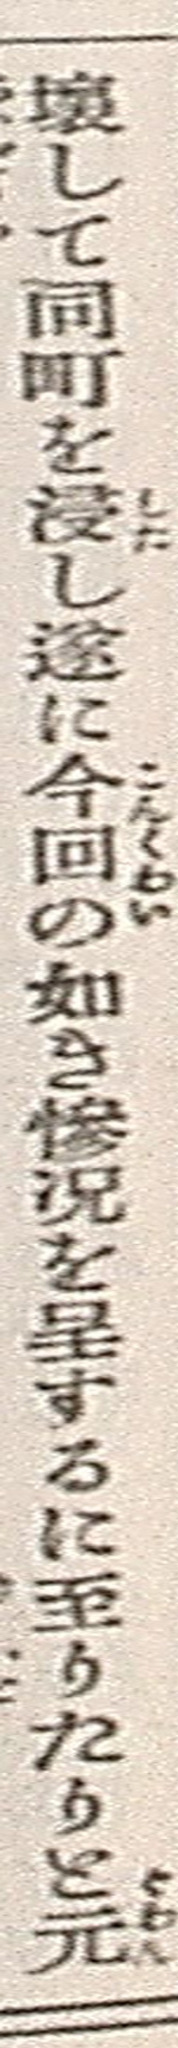壊して同町を浸し遂に今回の如き惨況を呈するに至りたりと元
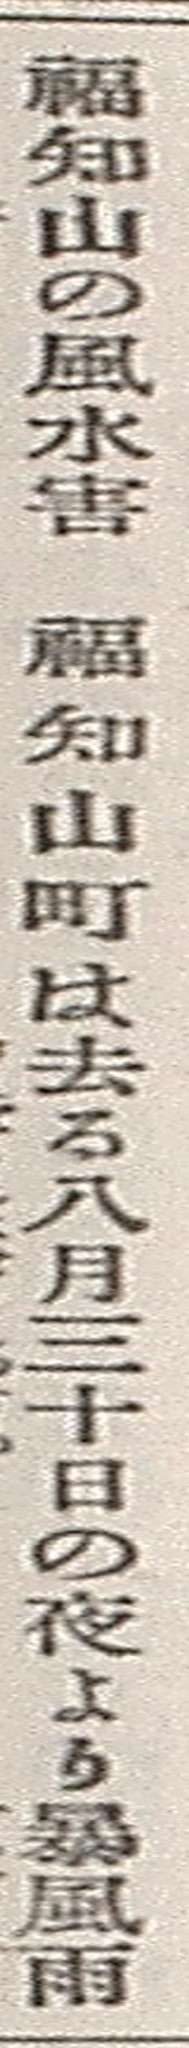福知山の風水害福知山町は去る八月三十日の夜より暴風雨
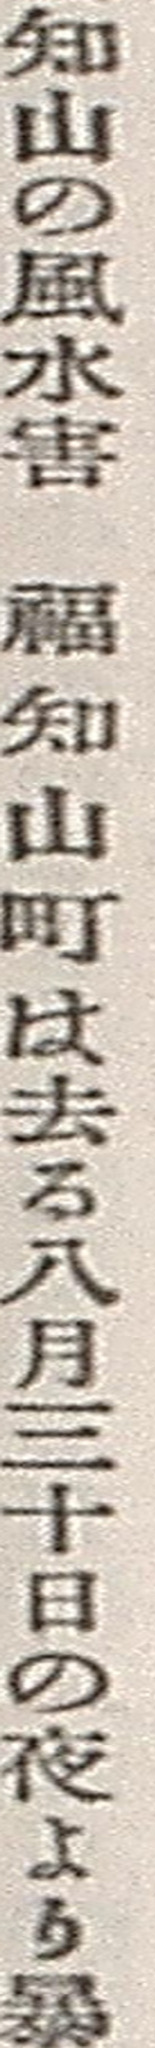福知山の風水害福知山町は去る八月三十日の夜より暴風雨
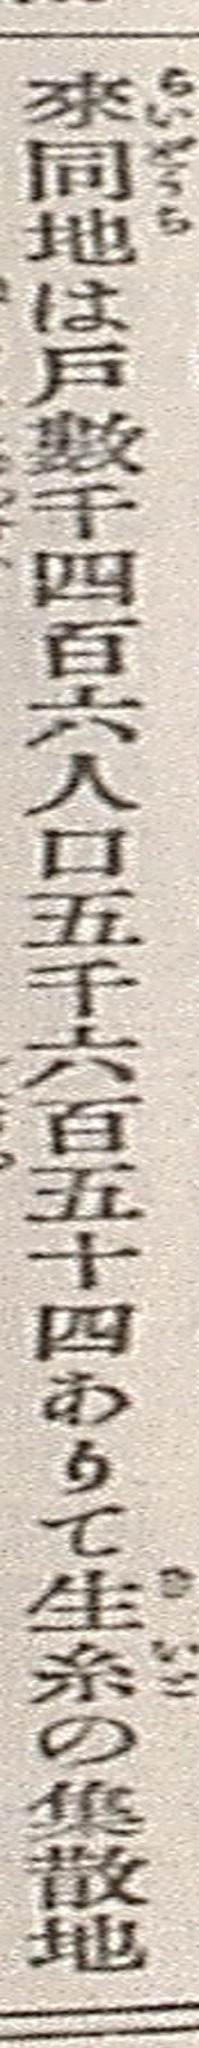来同地は戸数千四百六人口五千六百五十四ありて生糸の集散地
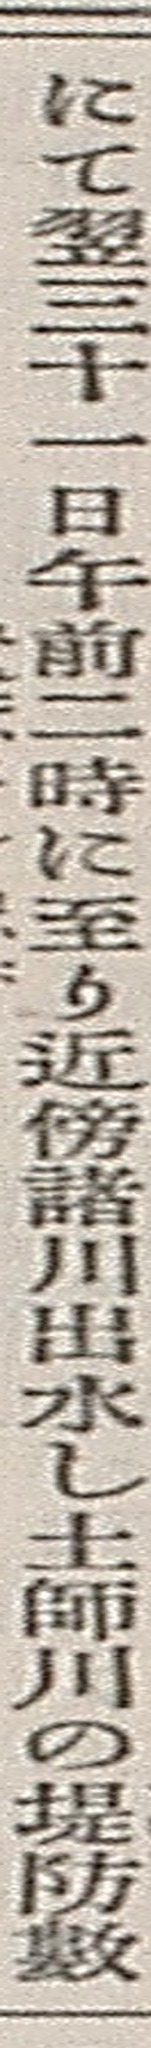にて翌三十一日午前二時に至り近傍諸川出水し土師川の堤防数
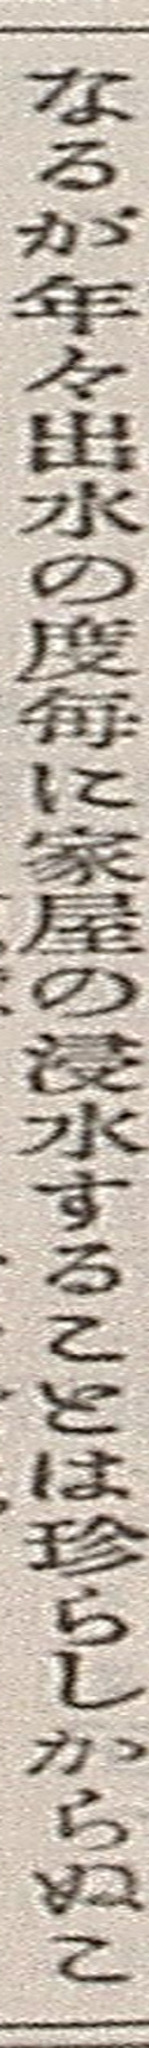なるが年々出水の度毎に家屋の浸水することは珍らしからぬこ
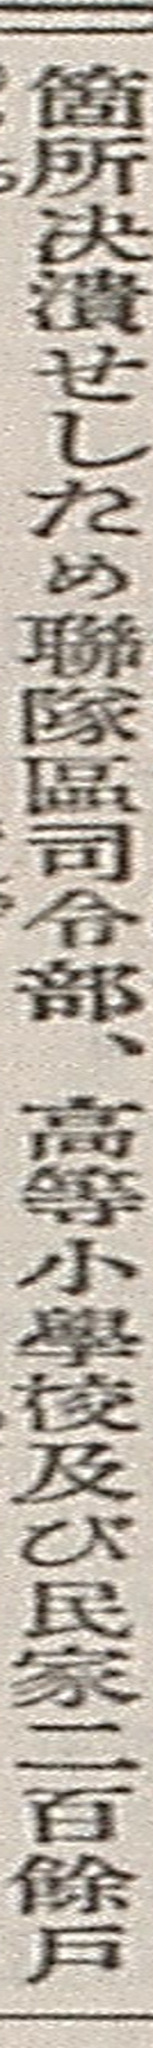箇所决潰せしため聯隊區司令部、高等小学校及び民家二百餘戸
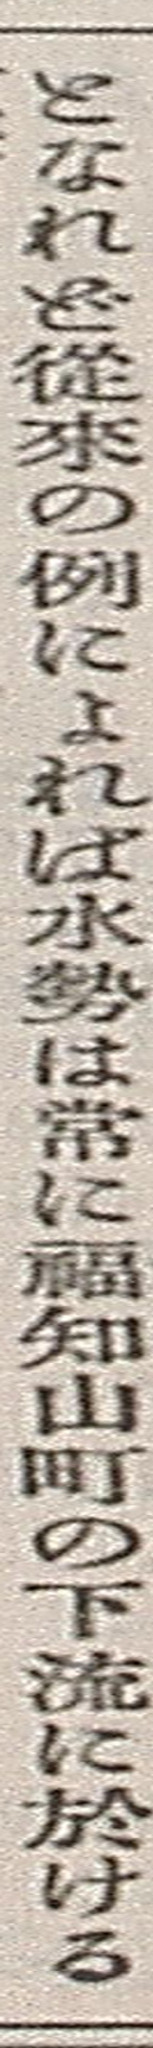となれど従来の例によれば水勢は常に福知山町の下流に於ける
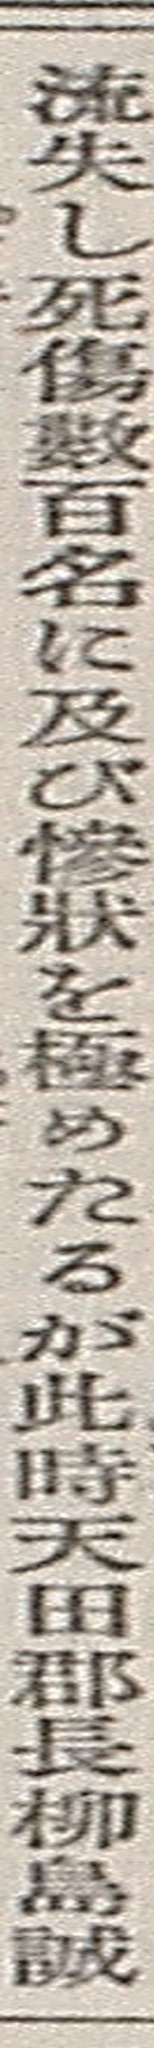流失し死傷百名に及び惨状を極めたるが此時天田郡長柳島誠
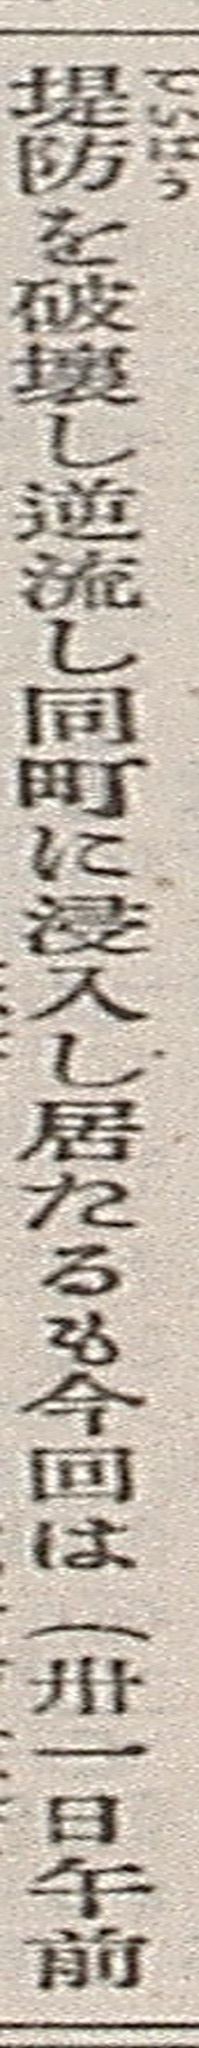堤防を破壊し逆流し同町に侵入居たるも今回は（卅一日午前
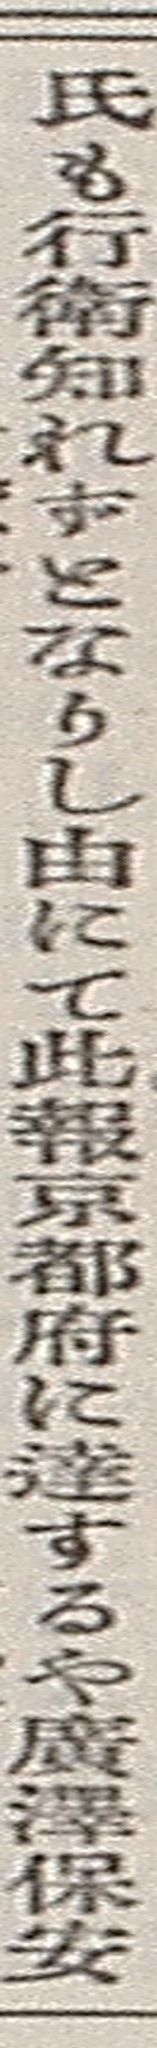氏も行衛知れずとなりし由にて此報京都府に達するや広沢保安
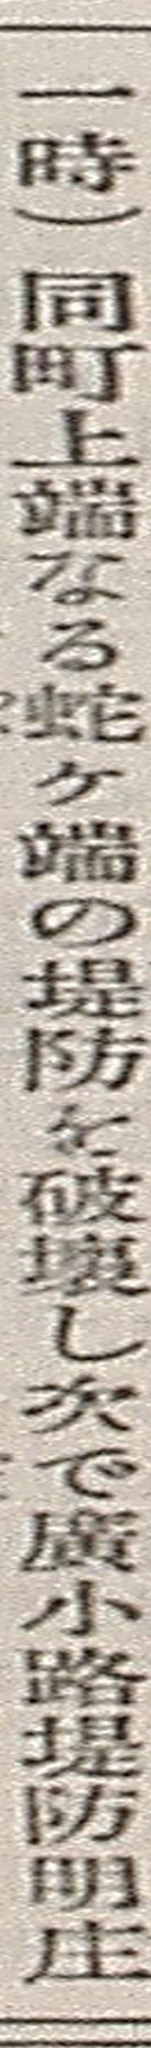一時）同町上端なる蛇ヶ端の堤防を破壊し次で広小路堤防明庄
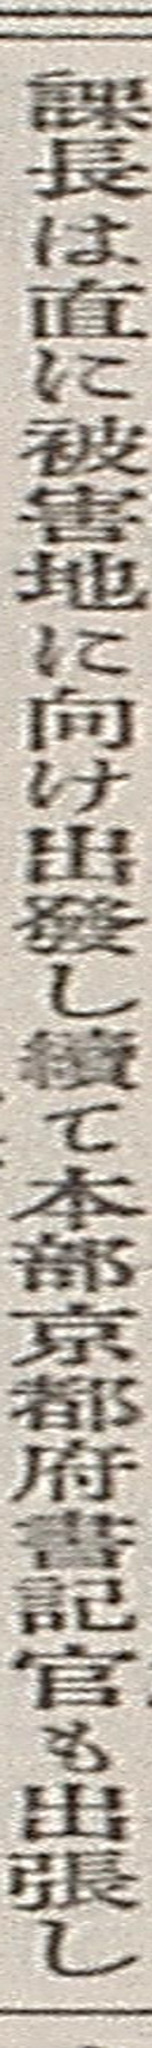課長は食に被害地に向け出発し続て本部京都府書記官も出張し
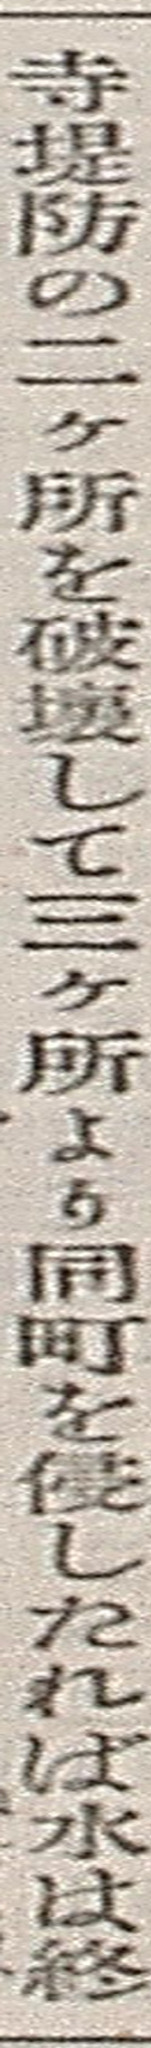寺堤防の二ヶ所を破壊して三ヶ所より同町を侵したれば水は終
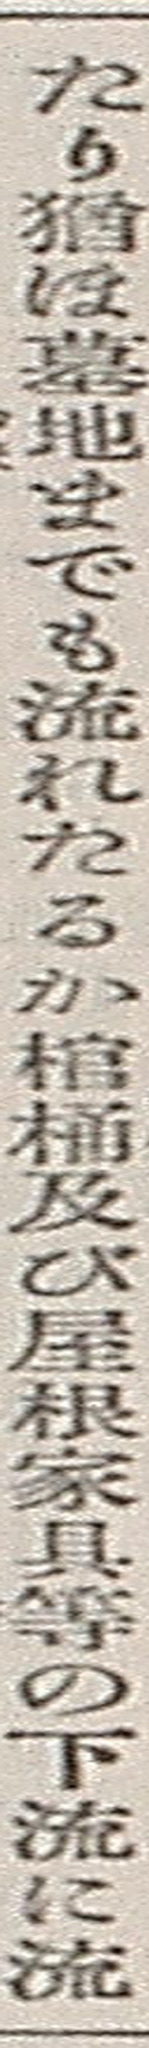たり猶ほ墓地までも流れたるか棺桶及び屋根家具等の下流に流
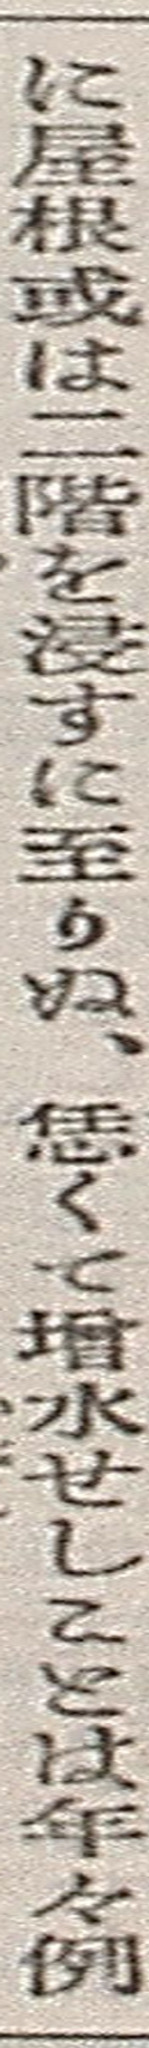に屋根或は二階を浸すに至りぬ、恁くて増水せしことは年々例
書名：風俗畫報臨時増刊第百二十六號　洪水被害録（中）
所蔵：東京大学地震研究所図書室 Earthquake Research Institute Library, The University of Tokyo, JAPAN
